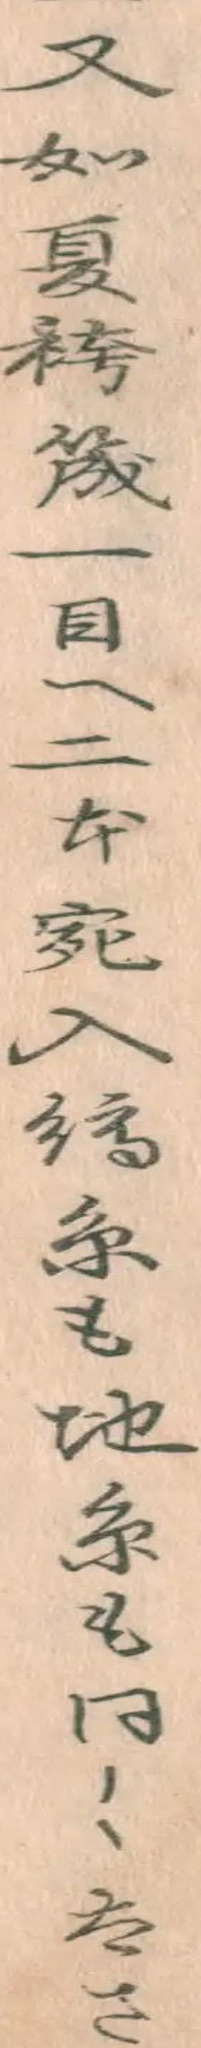一又如夏袴筬一目へ二本宛入縞糸も地糸も同し太さ
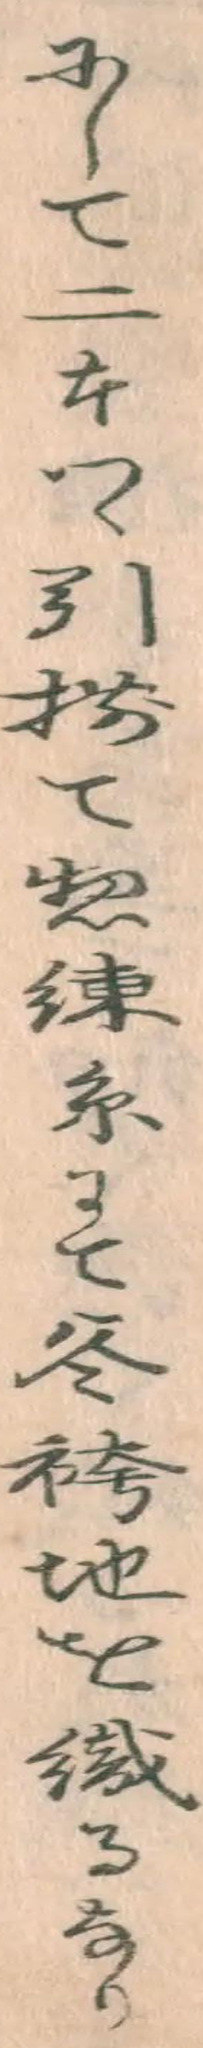にして二本つゝ引揃て惣練糸にて冬袴地を織るなり
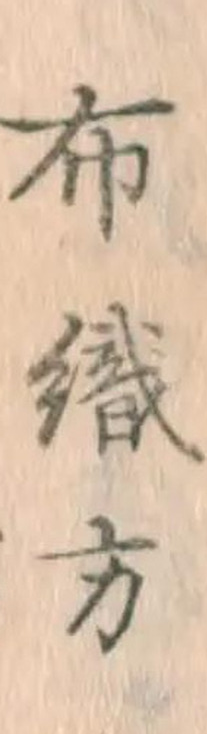布織方
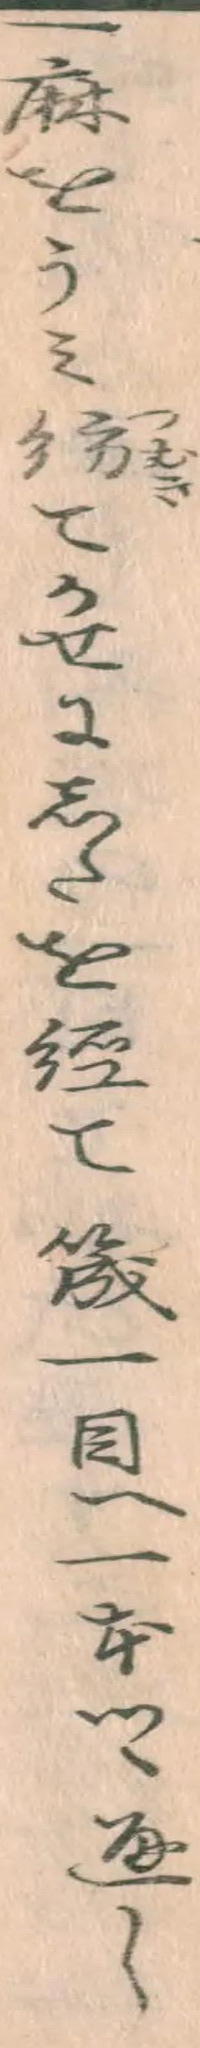一麻をうみ紡てかせにしたを経て筬一目へ一本つゝ通し
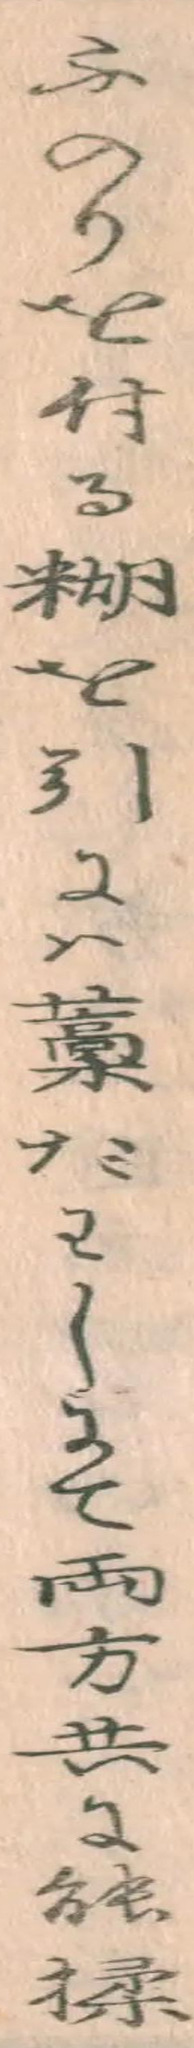ふのりを付る糊を引には藁たわしにて両方共に能揉
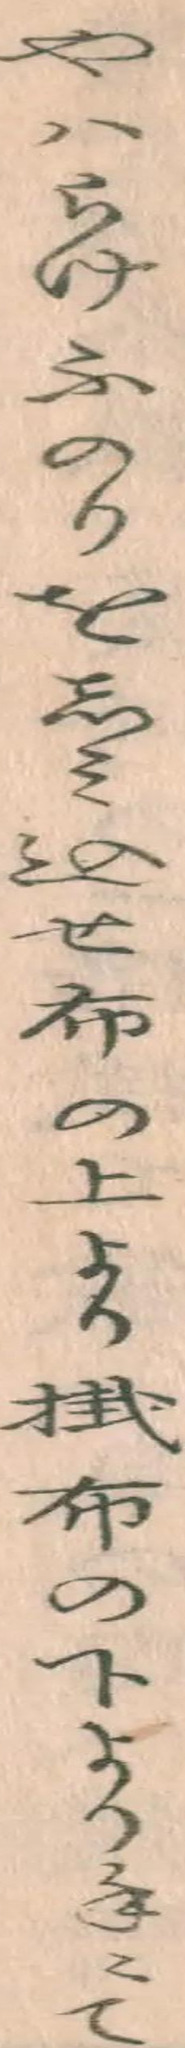やはらけふのりをしみ込せ布の上より掛布の下より手にて
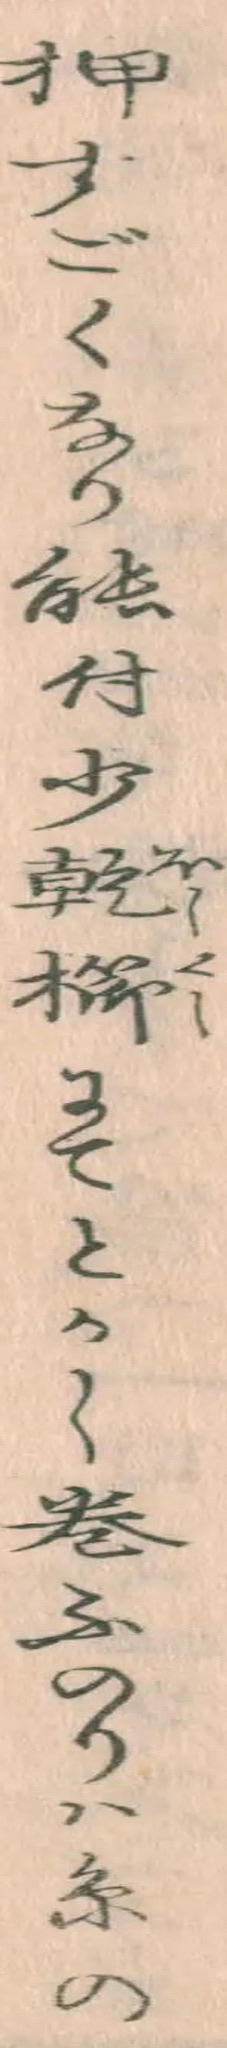押すごくなり能付少乾櫛にてとかし巻ふのりは糸の
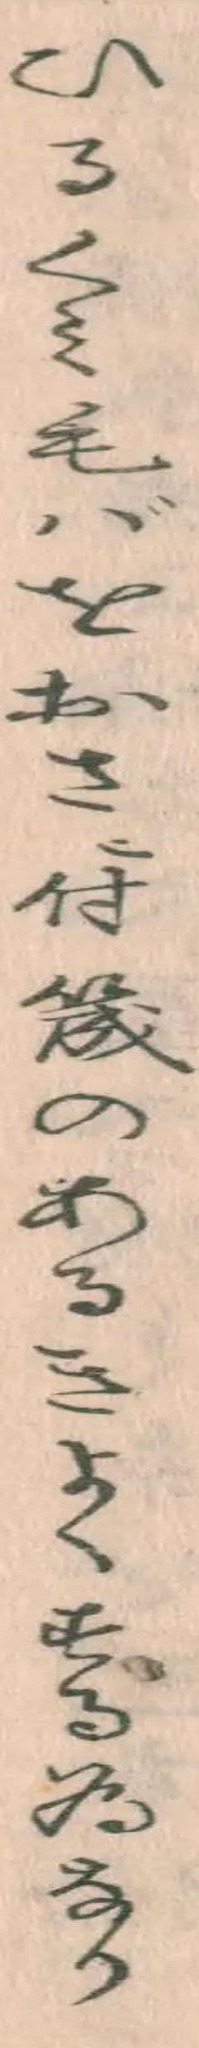ひるくみ毛ばをおさに付筬のあるきよくする為なり
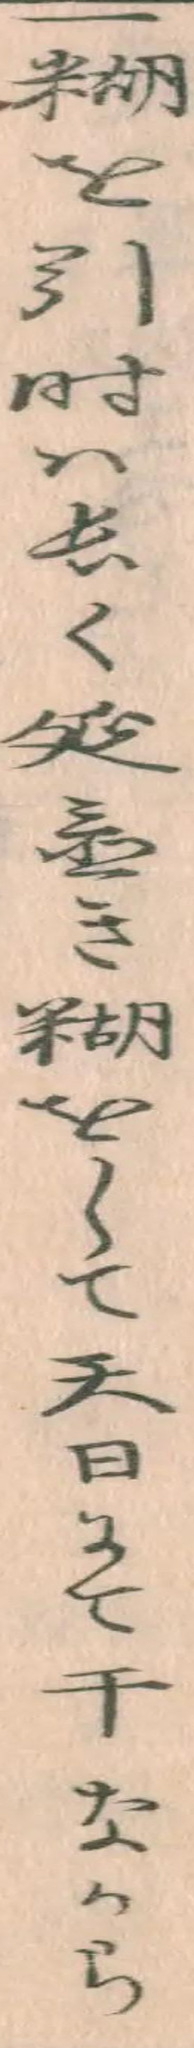一糊を引時は長く延置き糊をして天日にて干なから
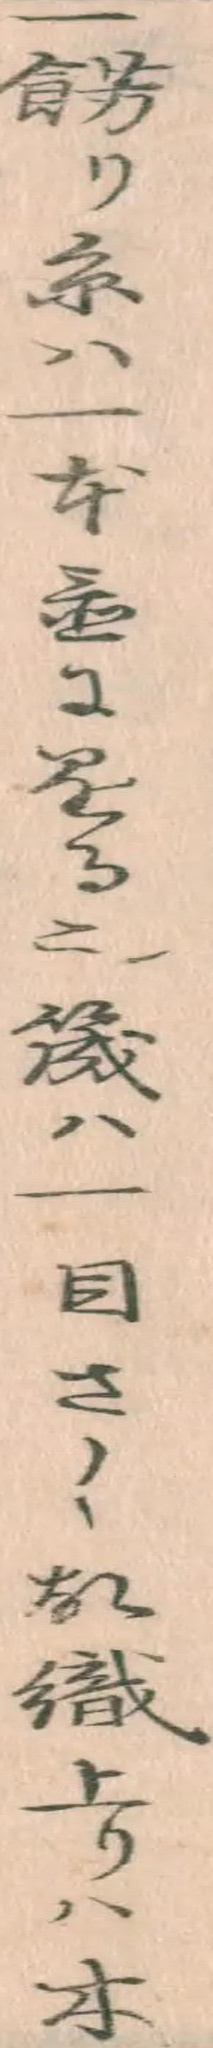一飾り糸は一本置に懸る也筬は一目さし故織上りは木
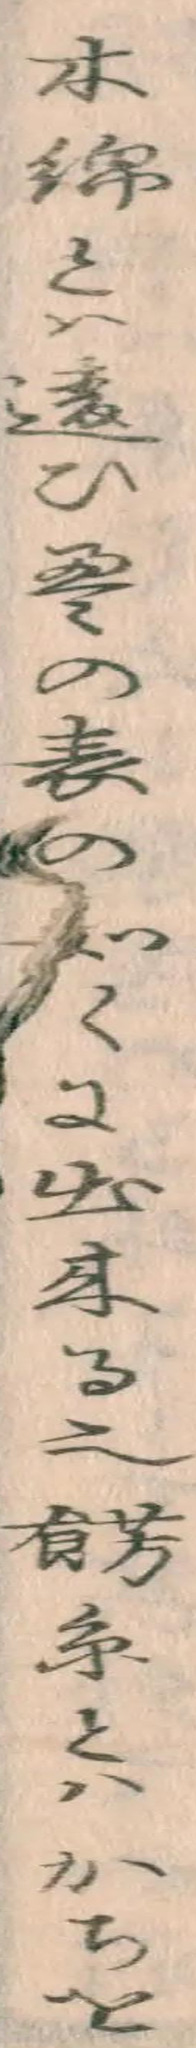木綿とは違ひ畳の表の如くに出来る也飾糸とはかちを
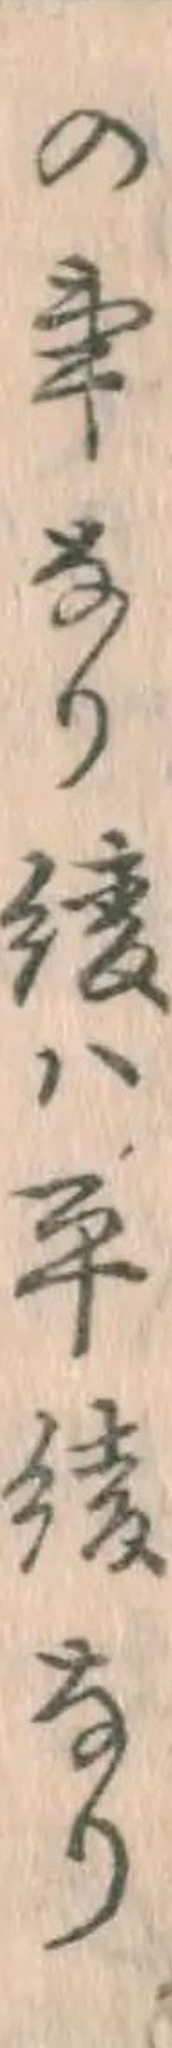の事なり綾は平綾なり
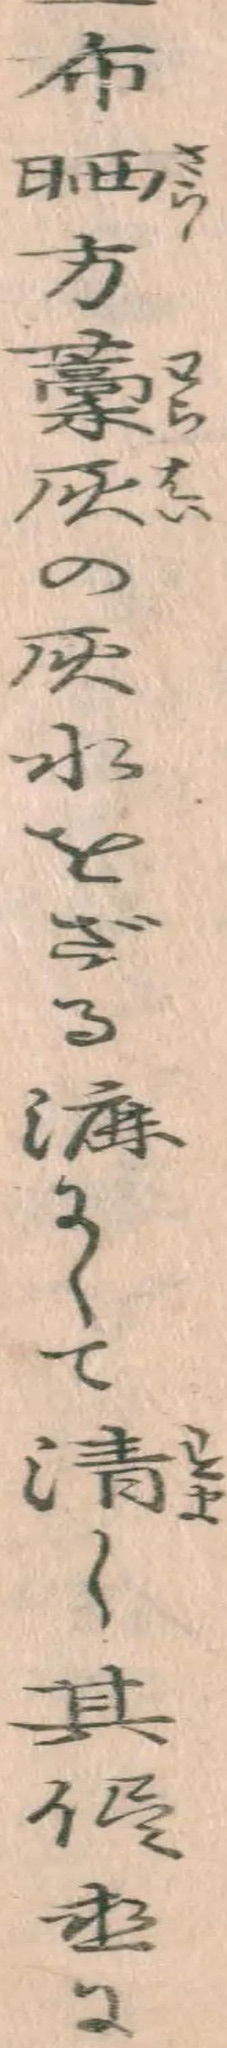一布晒方藁灰の灰水をざる漉にして清し其侭直に
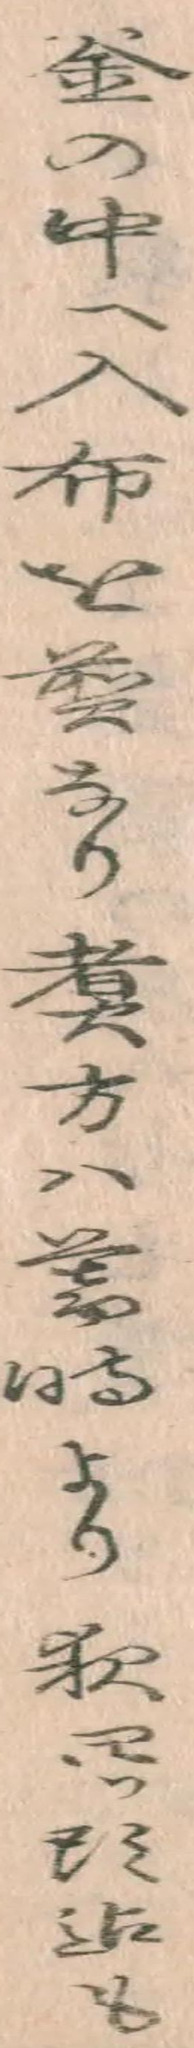釜の中へ入布を煎なり煮方は暮時より夜四ッ頃迄も
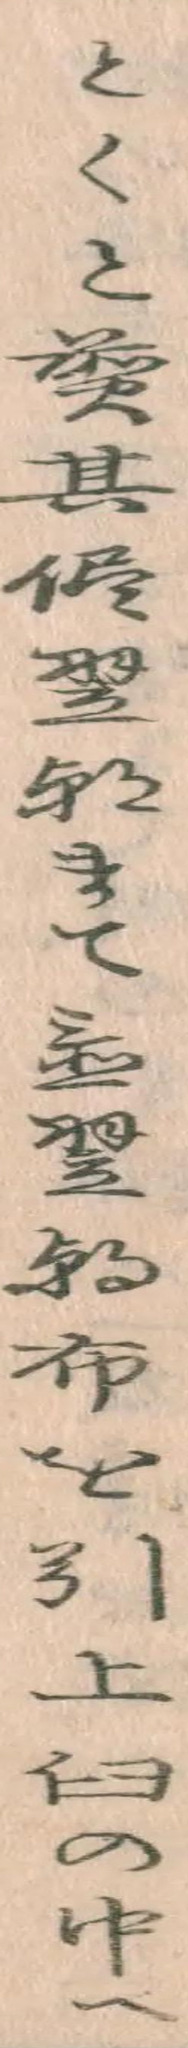とくと煎其侭翌朝まて置翌朝布を引上臼の中へ
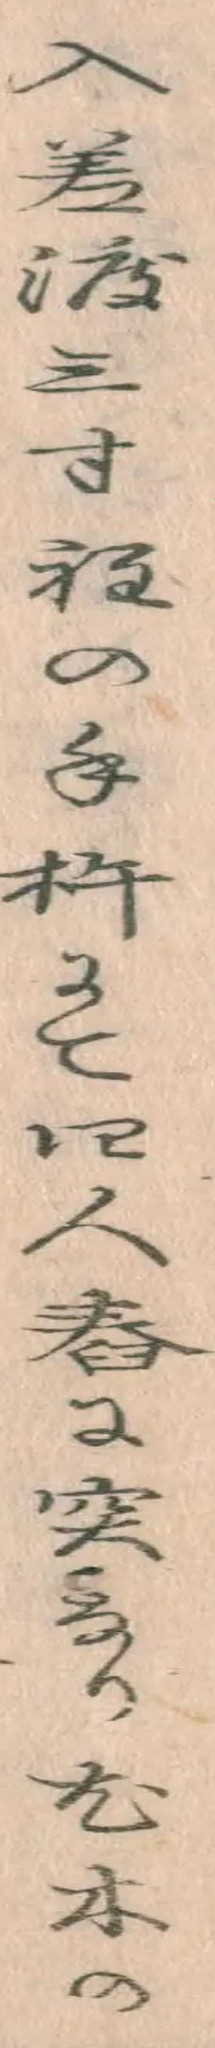入差渡三寸程の手杵にて四人舂に突なり尤木の
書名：機織彙編 5巻. [2]
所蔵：国立国会図書館 National Diet Library, JAPAN
